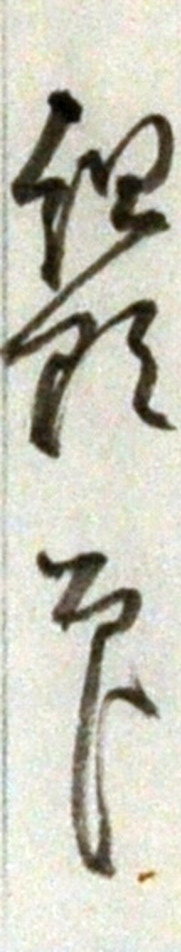組頭印
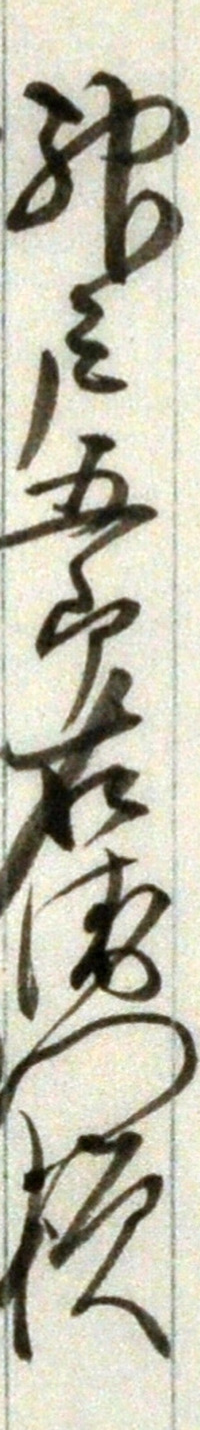神戸五郎右衛門様
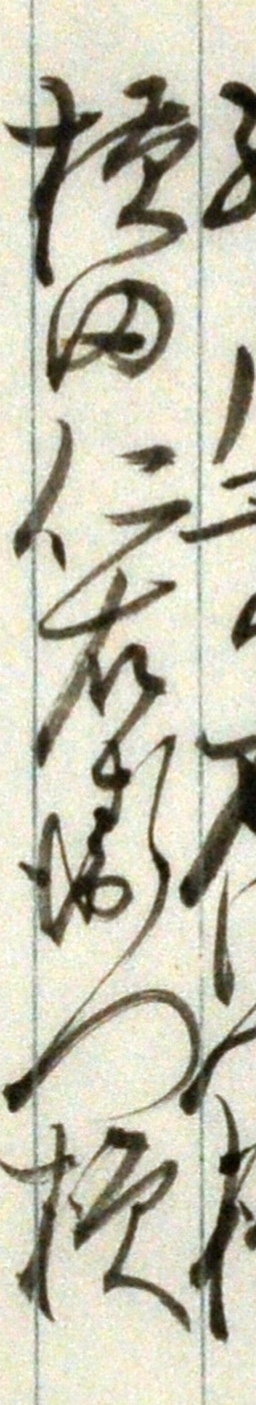横田仁右衛門様
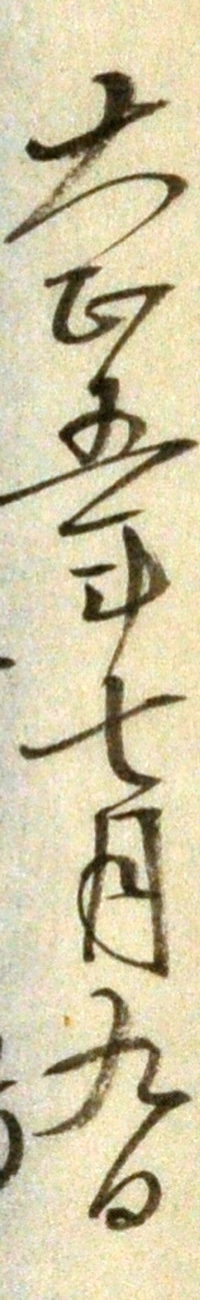大正五年七月九日
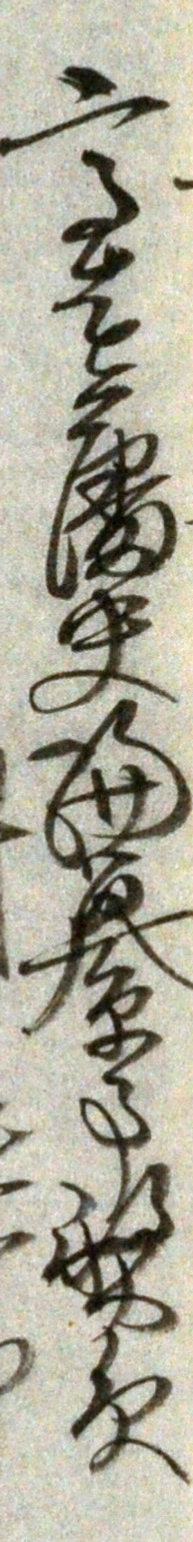高遠藩史編纂事務員
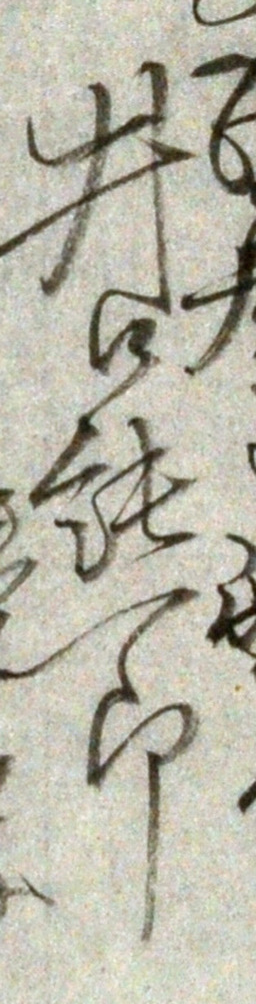井口純一郎
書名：藤沢郷中馬ニ関スル御法度請状
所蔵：伊那市立高遠町図書館・合同会社AMANE
